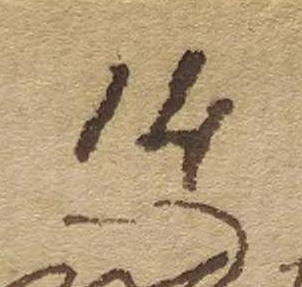14
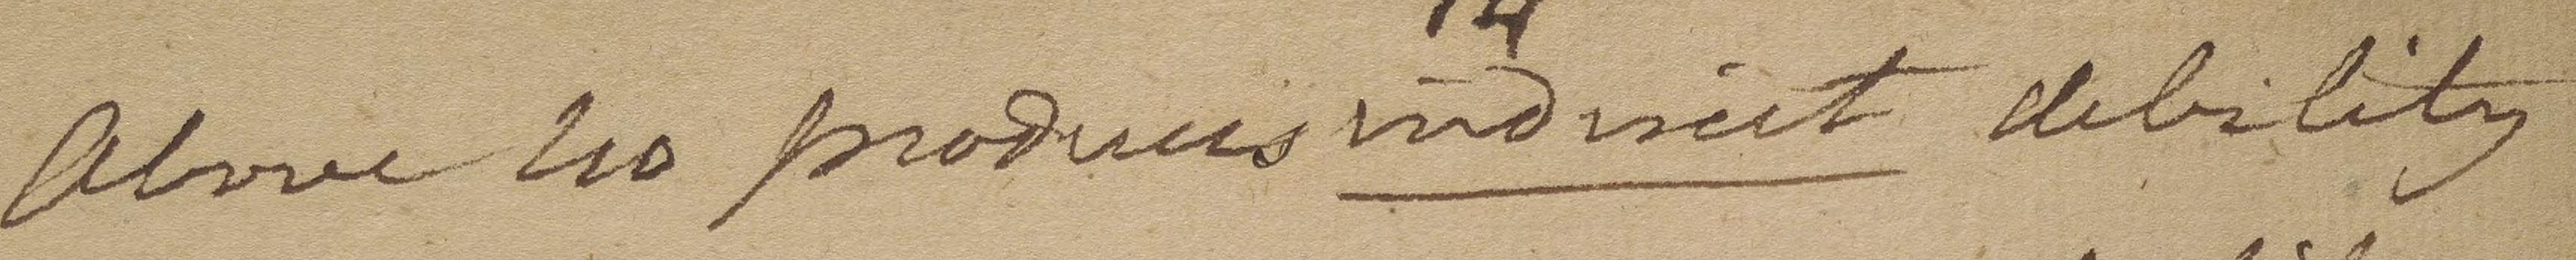Above no produces indirect debility.
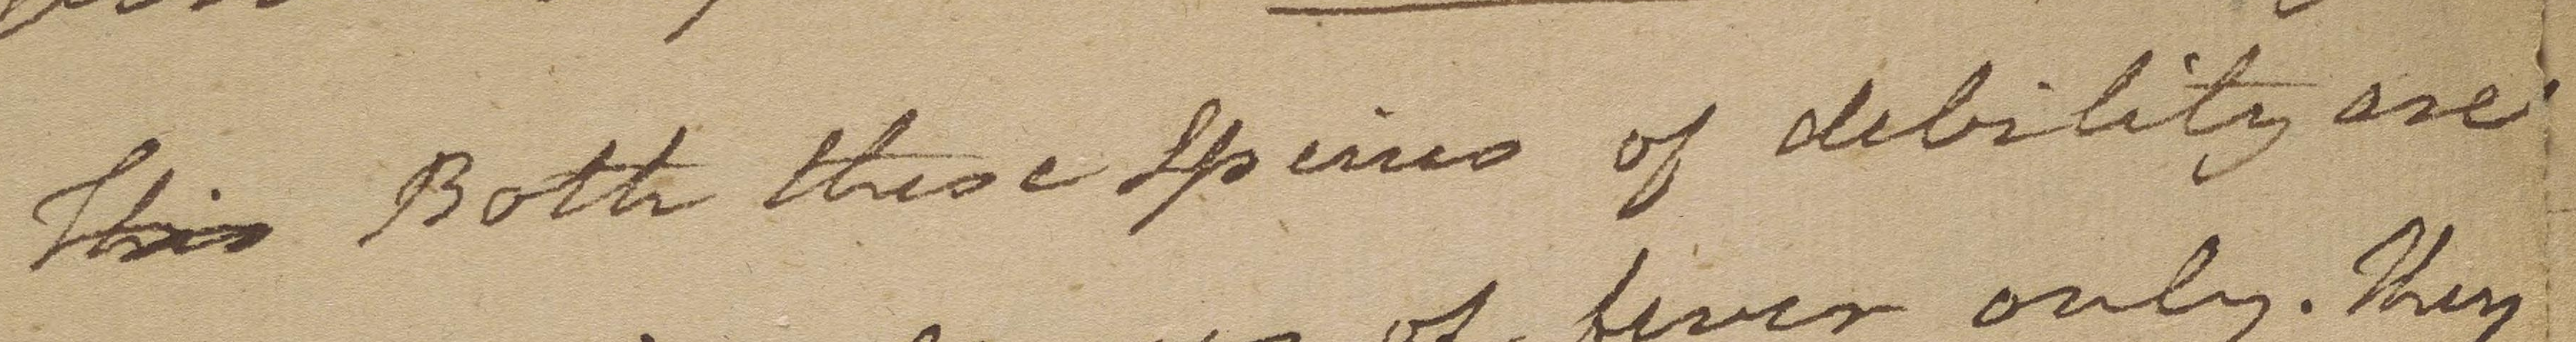[This] Both these species of debility are
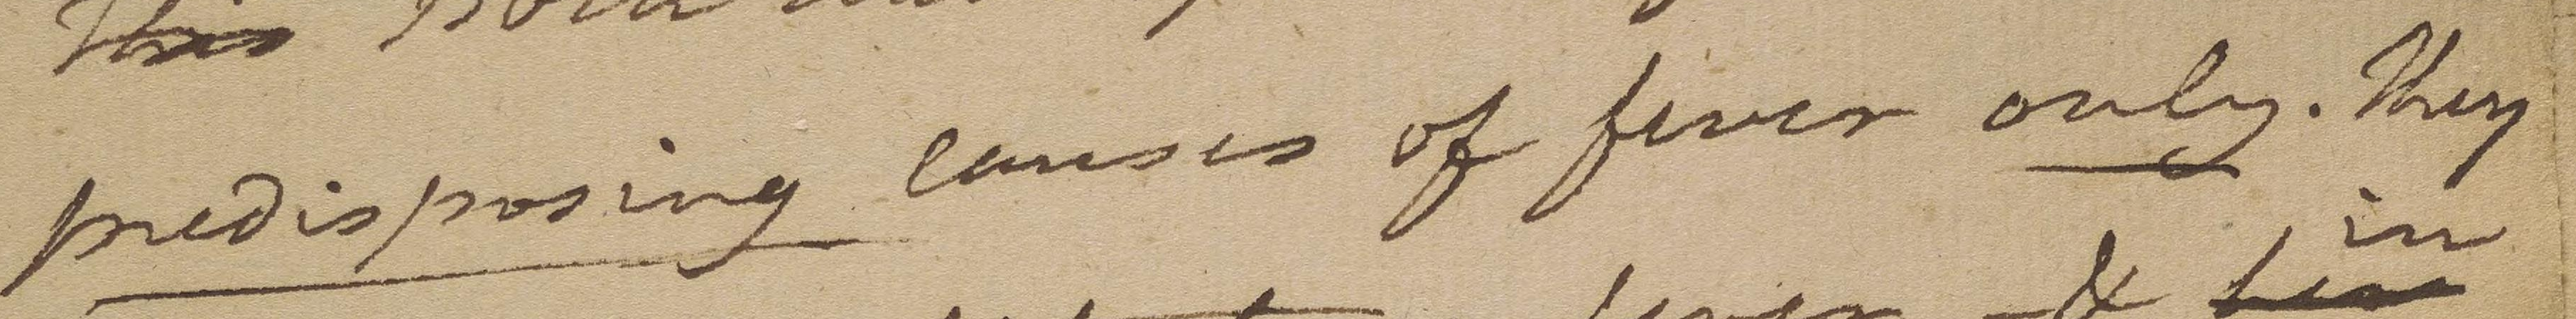predisposing causes of fever only. They
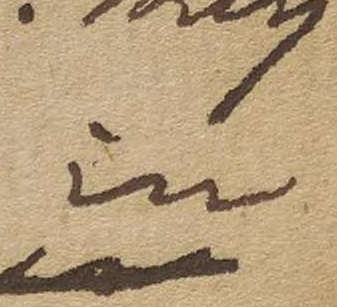in
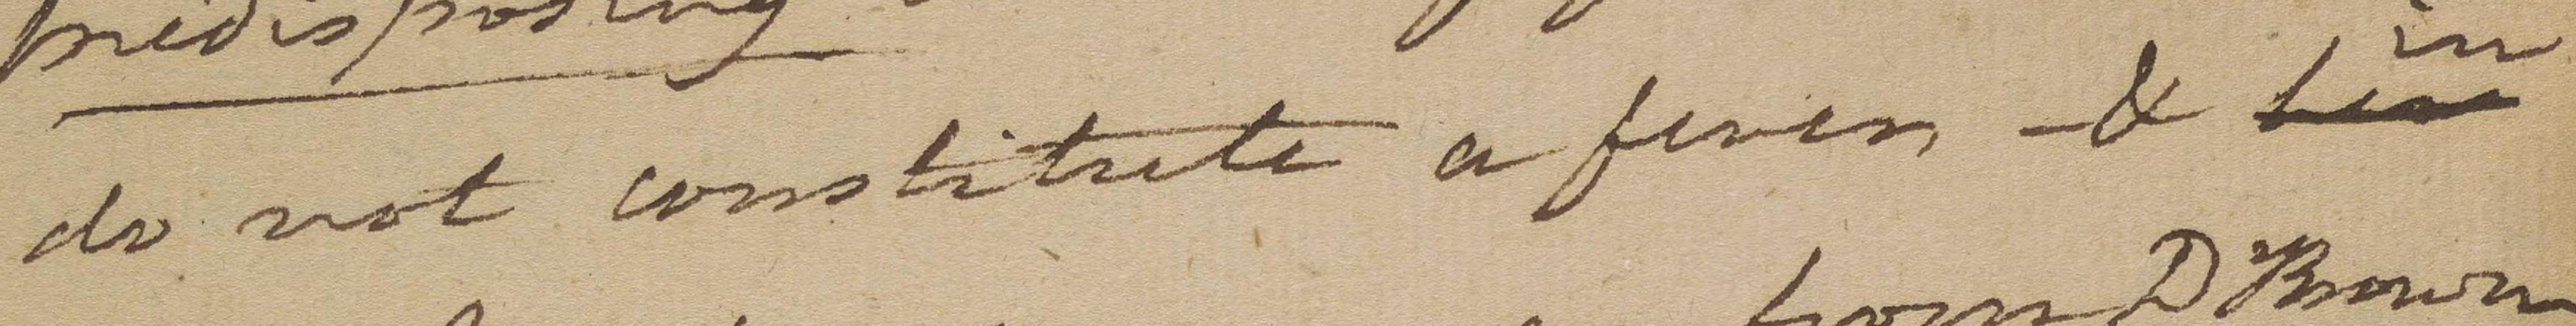do not constitute a fever & [___]
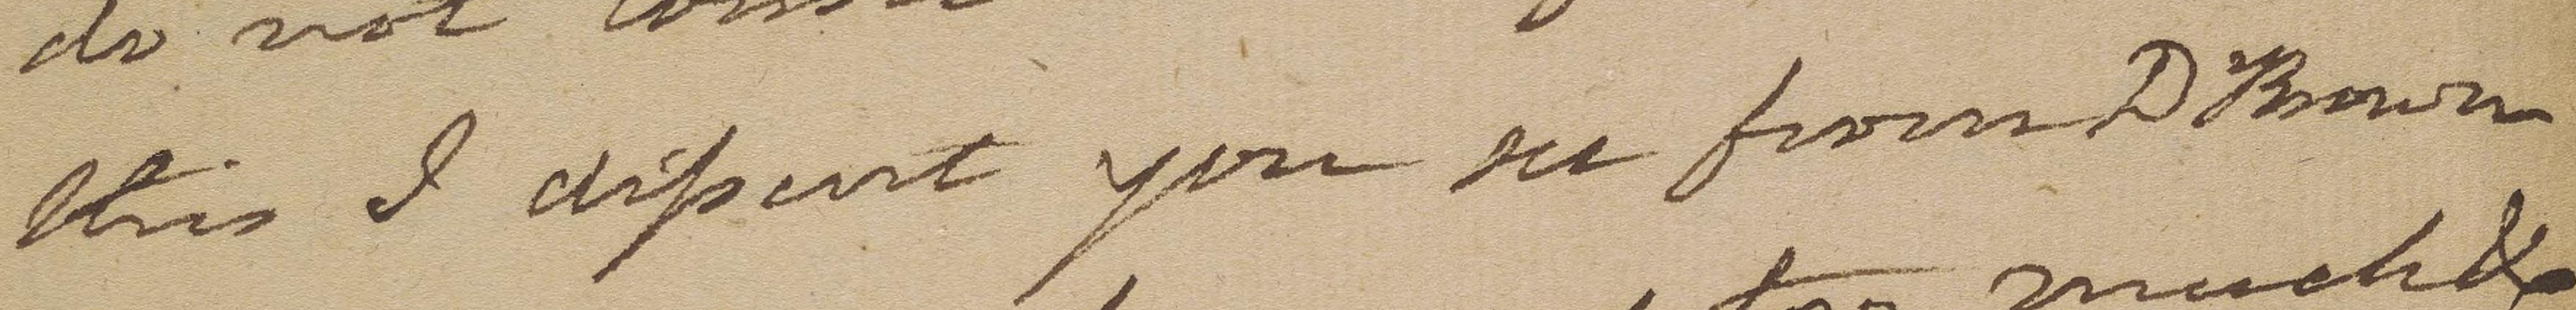this I dissent you re from D^r Brown
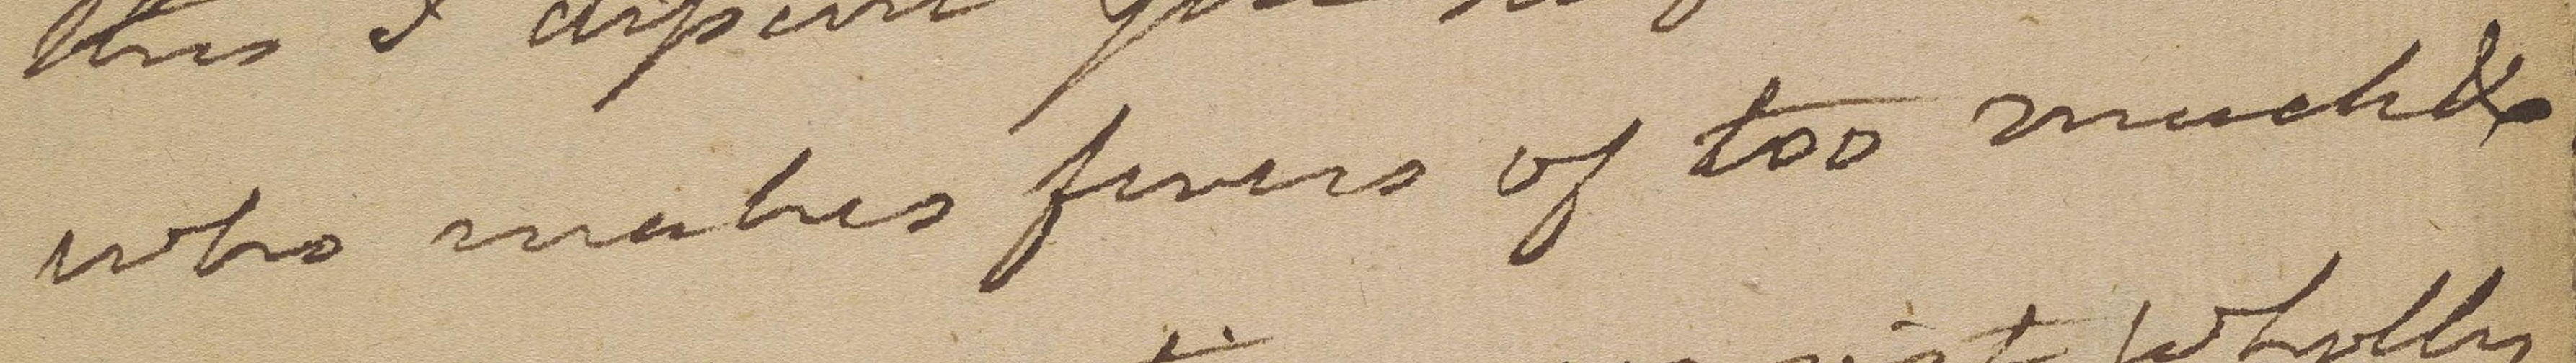who makes fevers of too much &
